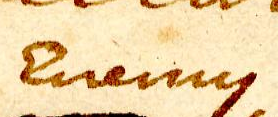Enemy
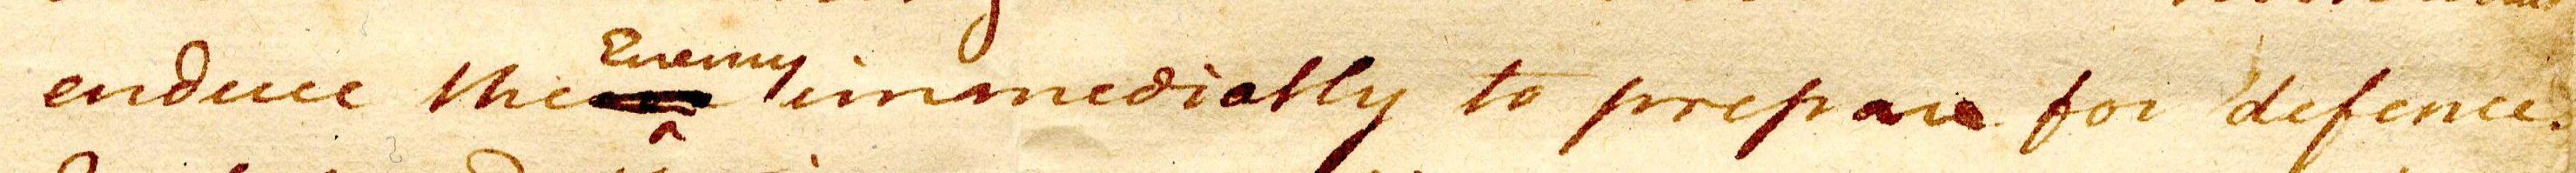enduce the immediatly to prepare for defence.
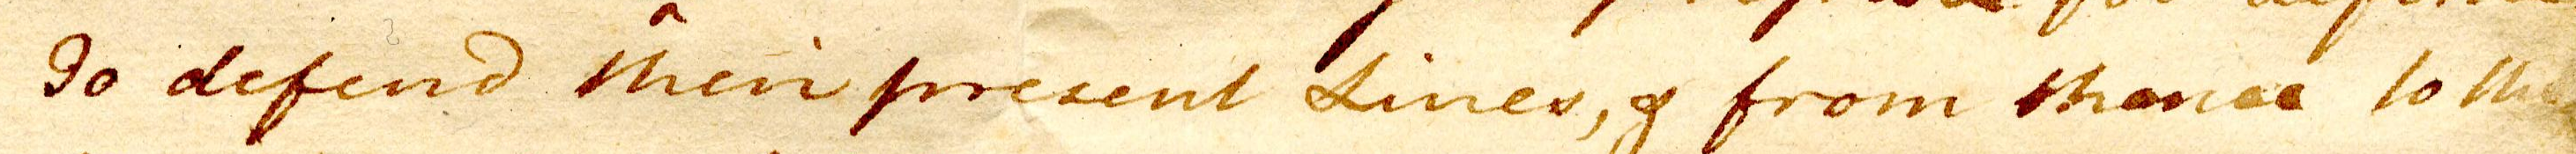To defend their present Lines, & from thence to the
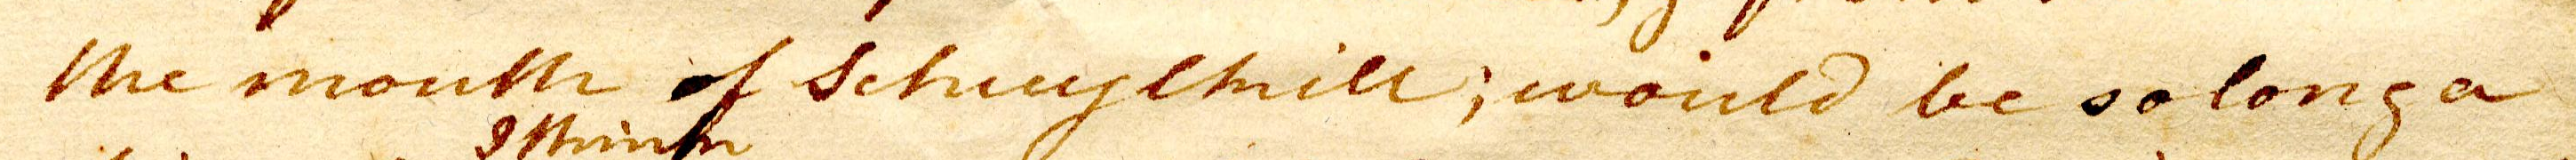the mouth of Schuylkill; would be so long a
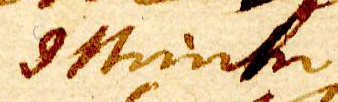I think
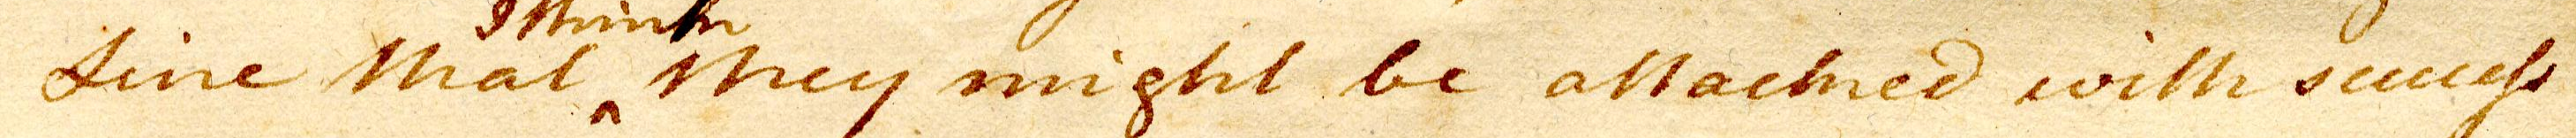Line that ^ they might be attacked with success
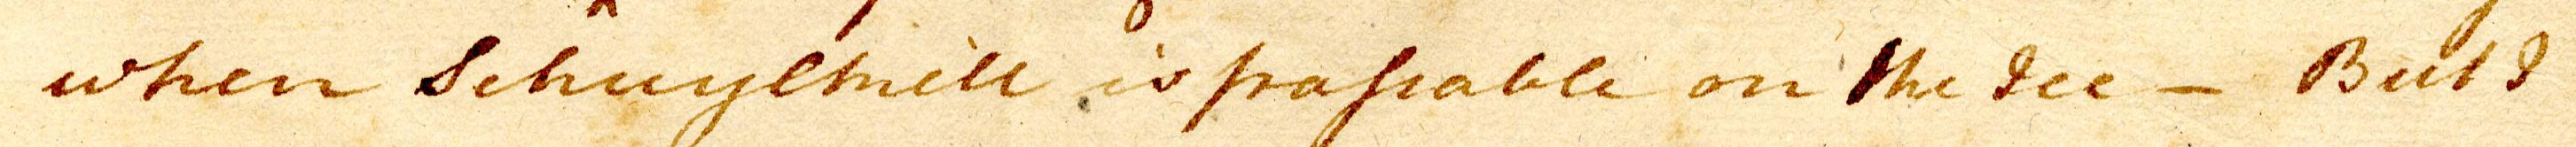when Schuylkill is passable on the Tee- But I
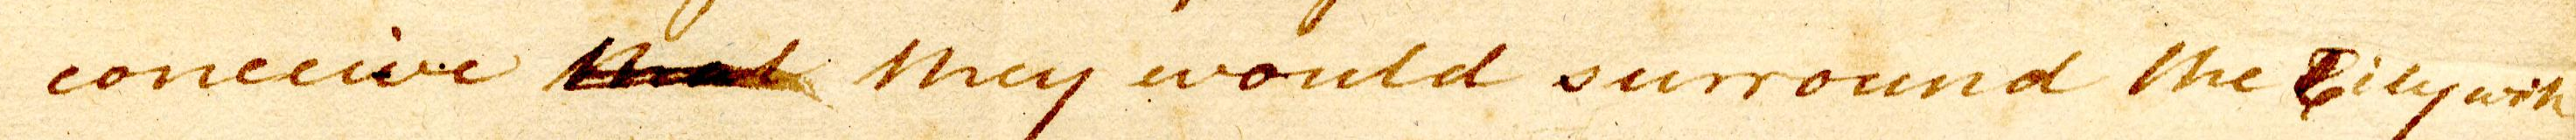conceive [that] they would surround the City with
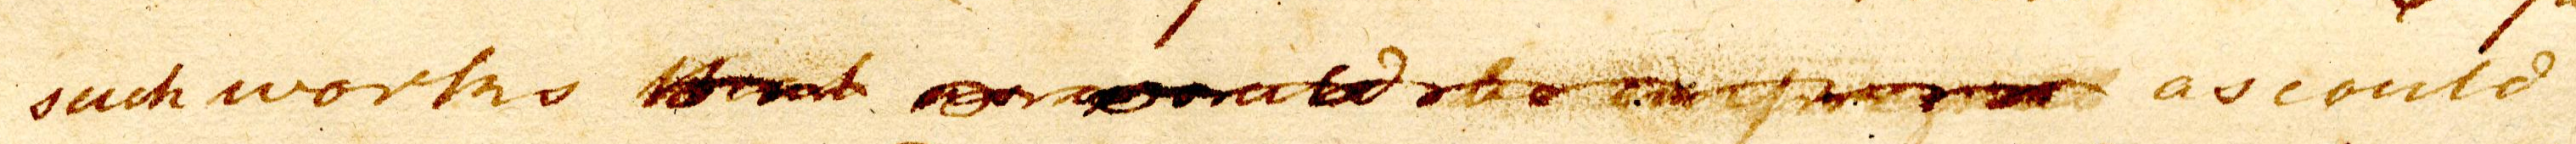such works [_____________________] as could
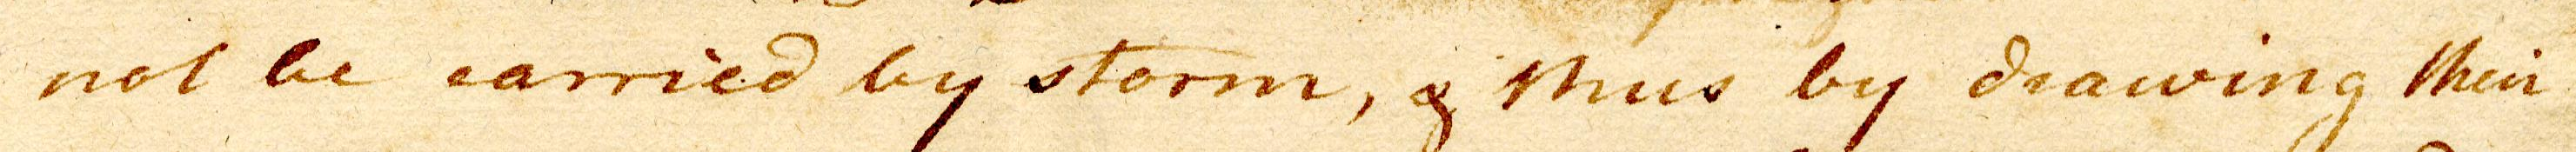not be carried by storm, & thus by drawing their
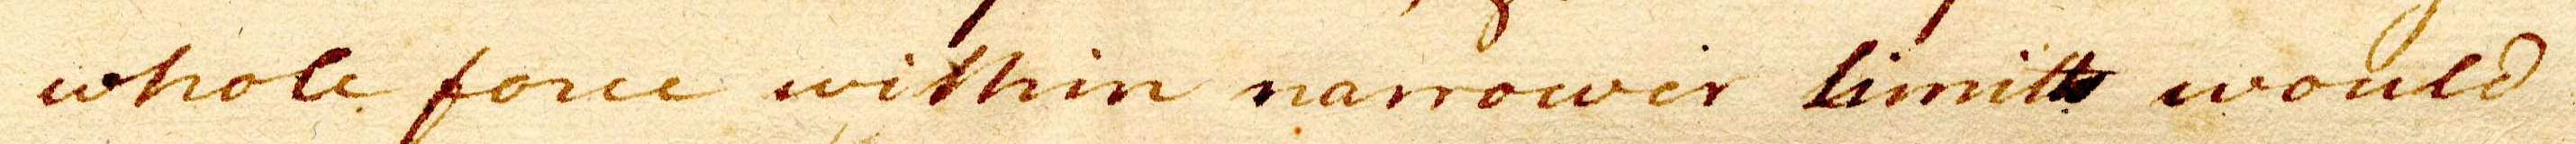whole force within narrower limitts would
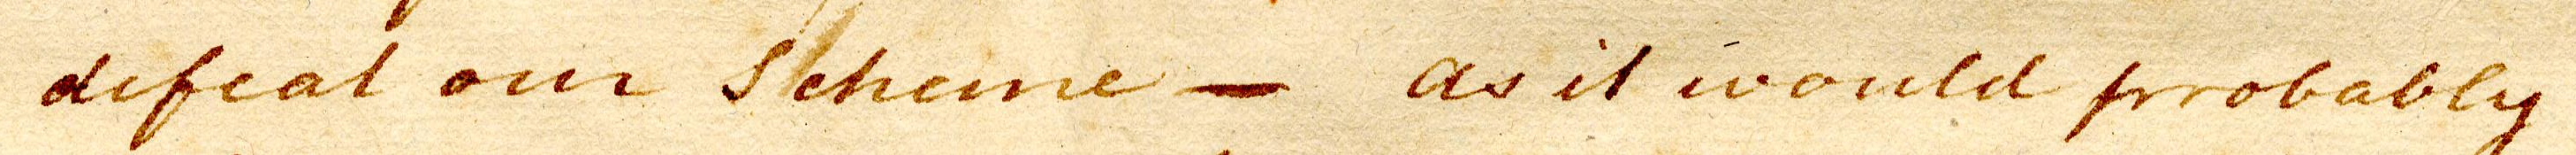defeat our scheme- As it would probably
